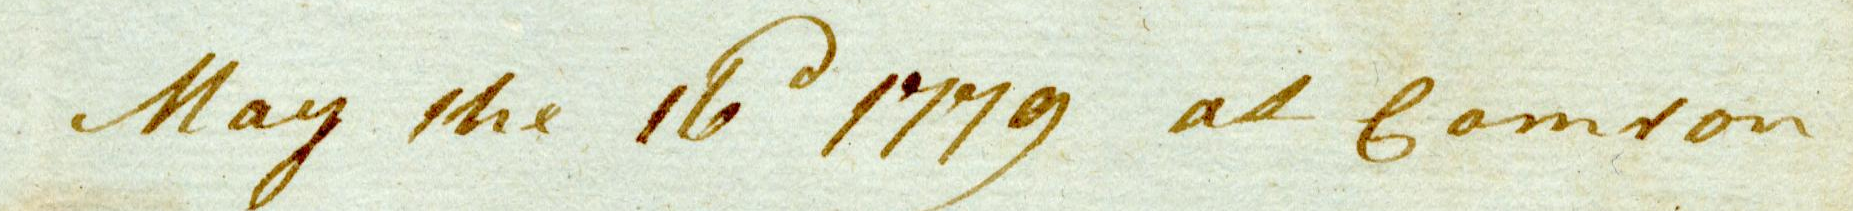May the 16^th. 1779 at Camron
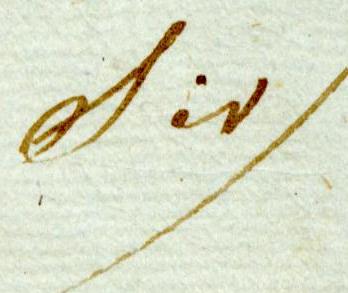Sir
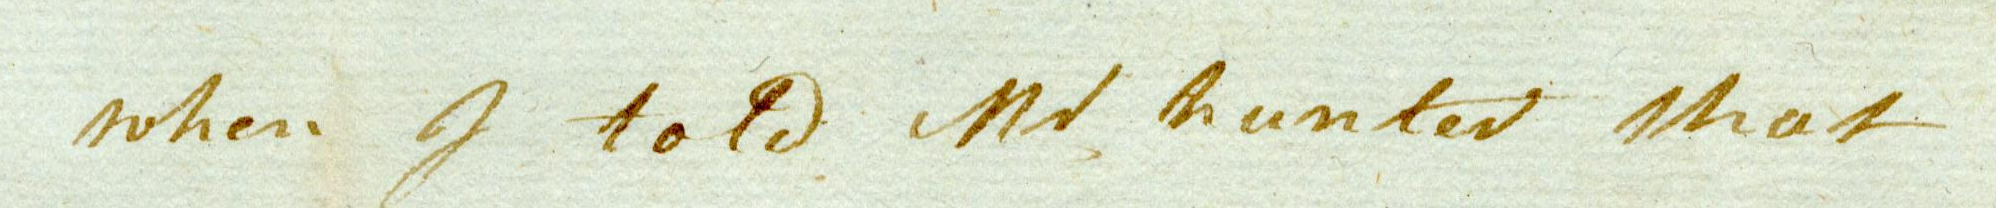when I told Mr hunter that
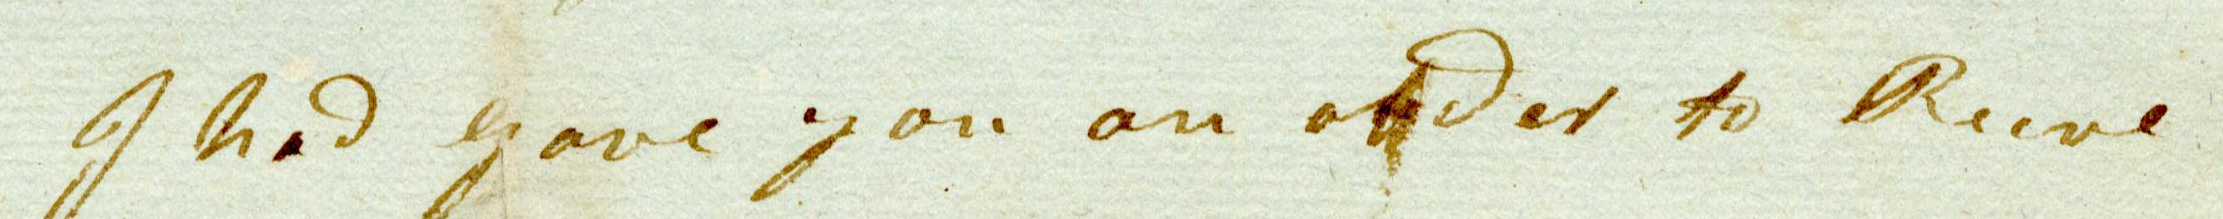I had gave you an order to Reeve
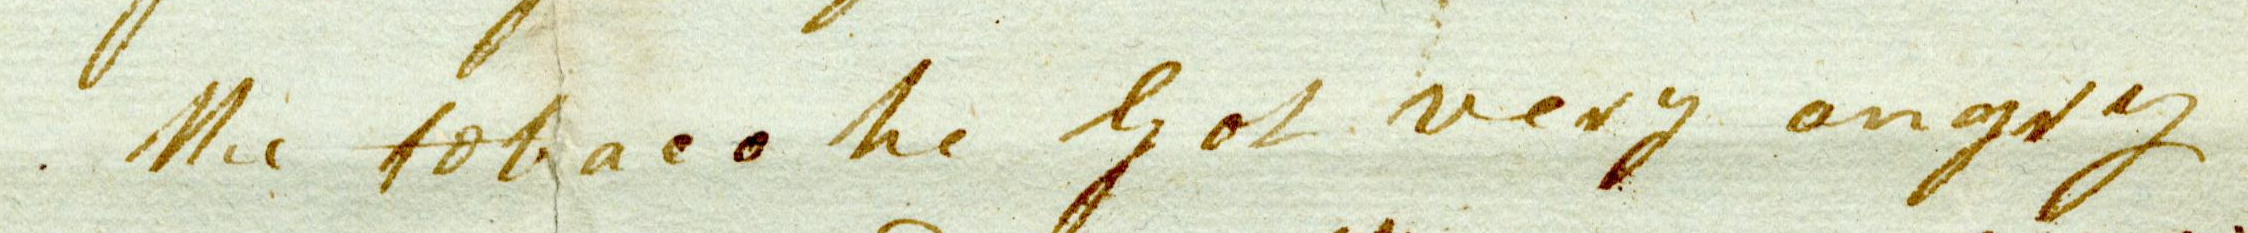the tobaco he Got very angryy
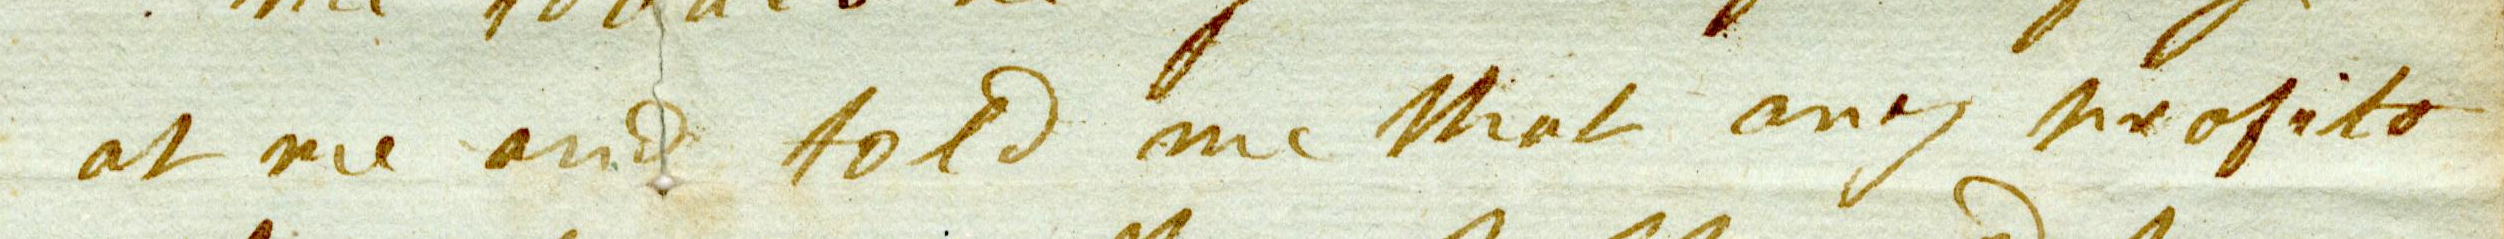at me and told me that any profits
